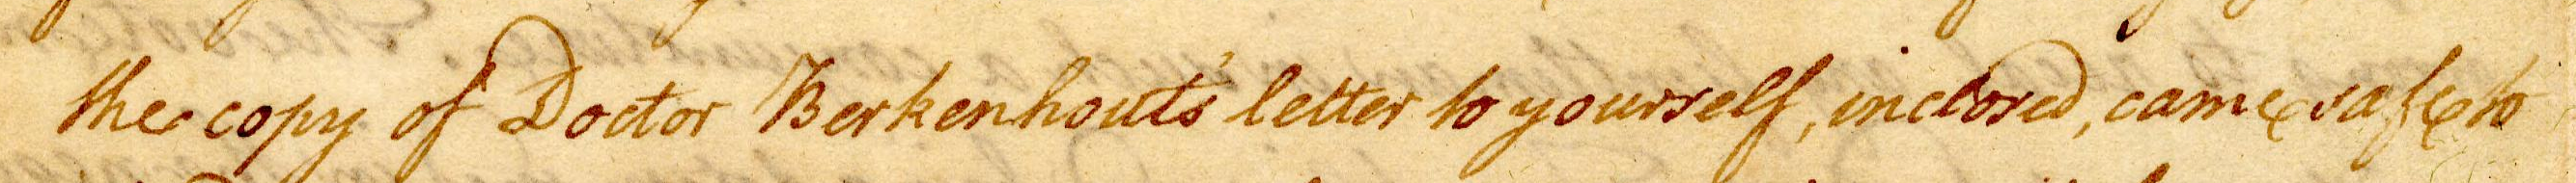the copy of Doctor Berkenhouts letter to yourself, inclosed, came safe to
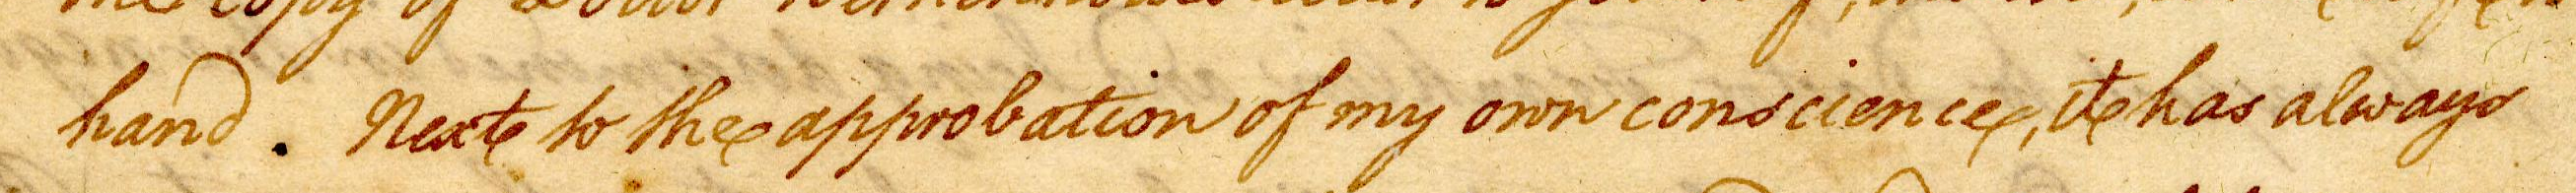hand. Next to the approbation of my own conscience, it has always
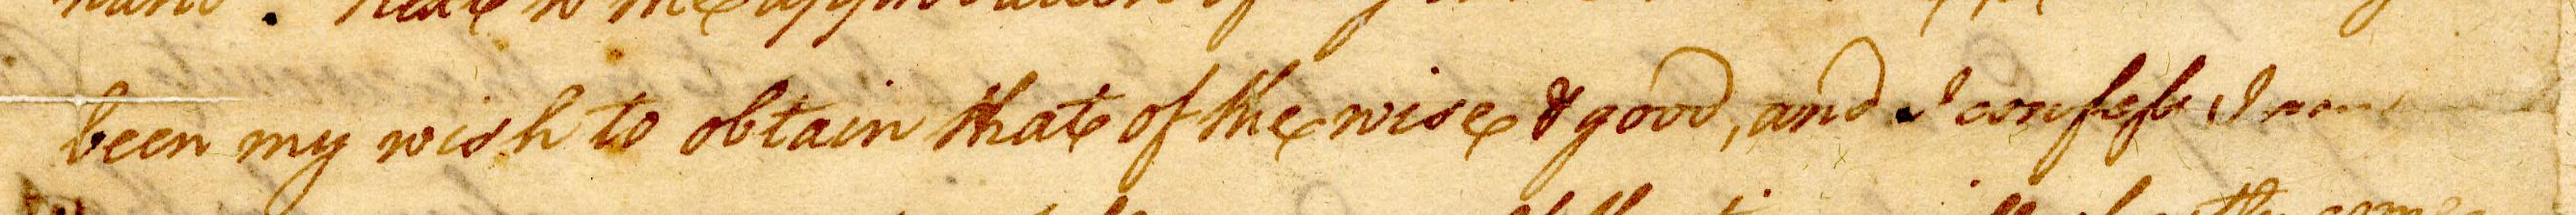been my wish to obtain that of the wise & good, and I confess I am
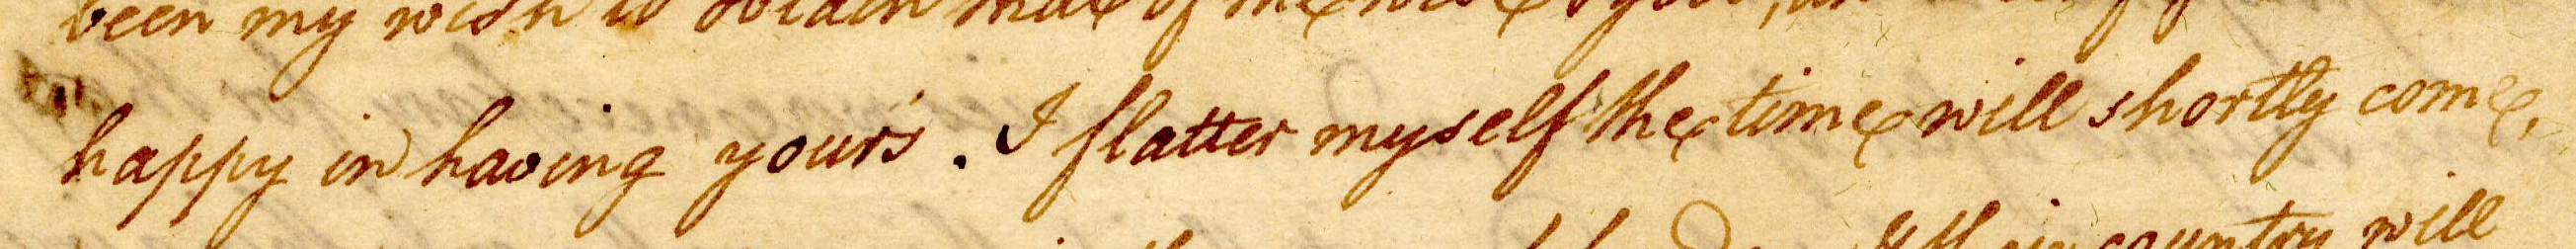happy in having yours. I flatter myself the time will shortly come
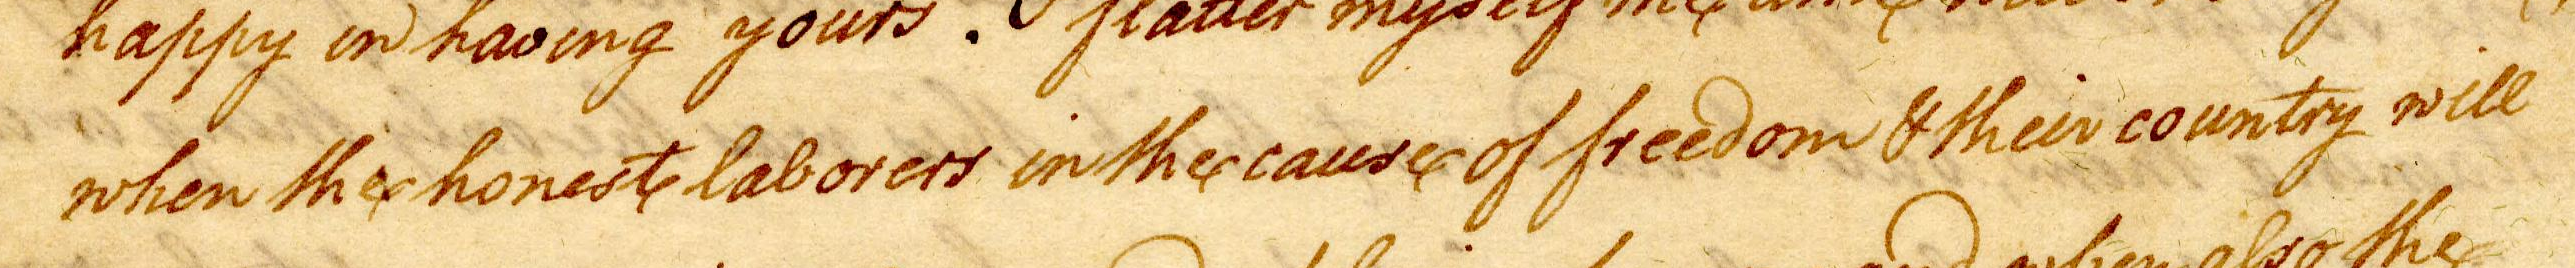when the honest laborers in the cause of freedom & their country will
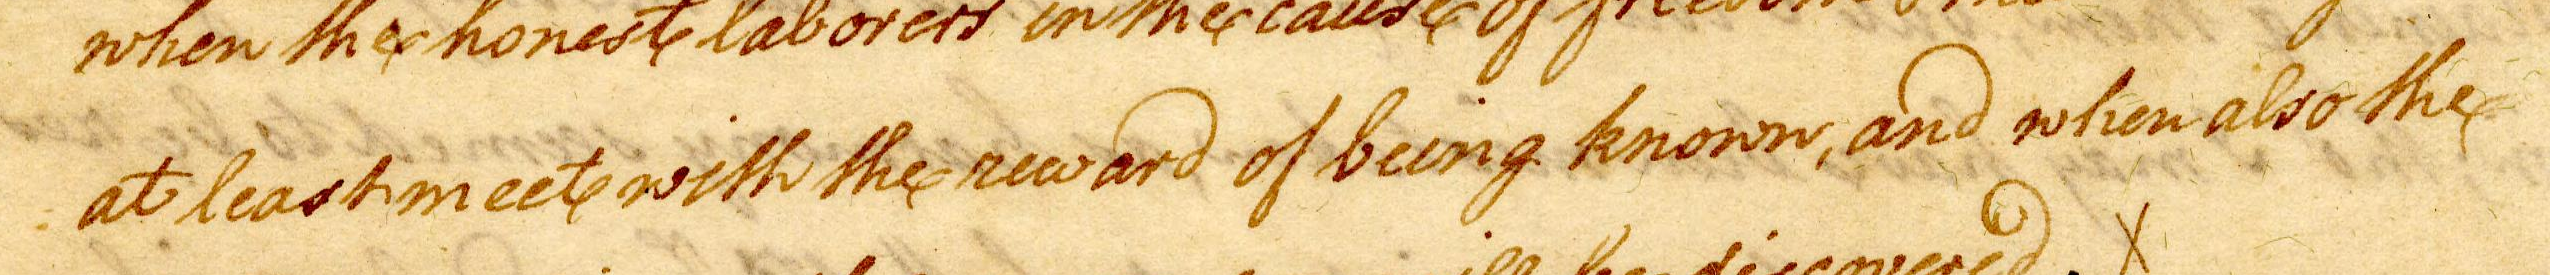at least meet with the reward of being known, and when also the
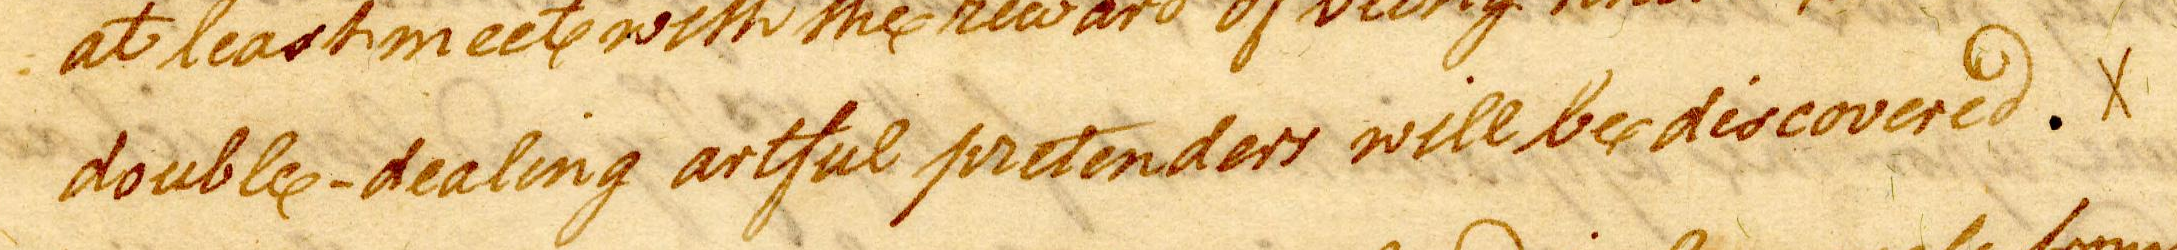double dealing artful pretenders will be discovered. X
